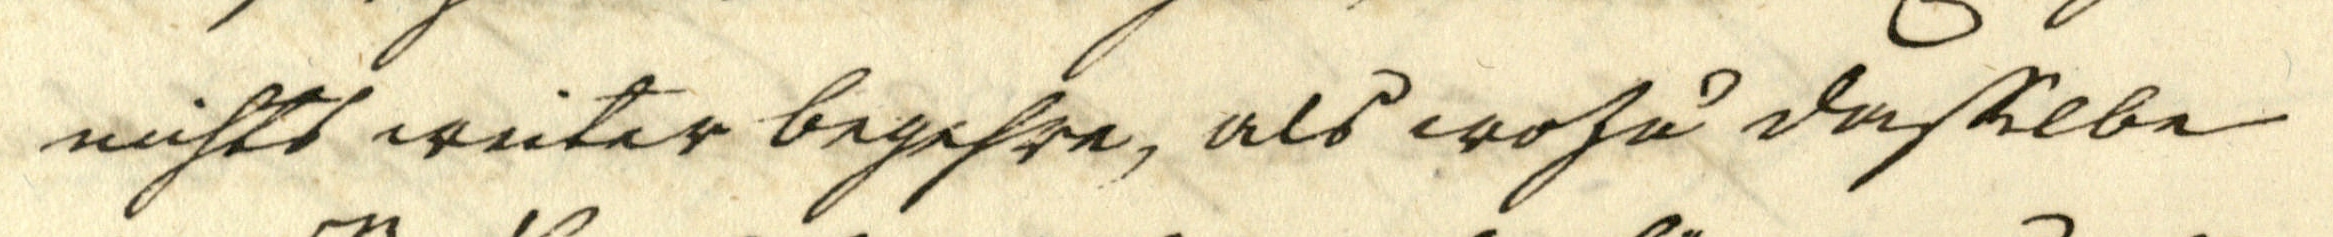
nichts weiter begehre, als wozu dasselbe
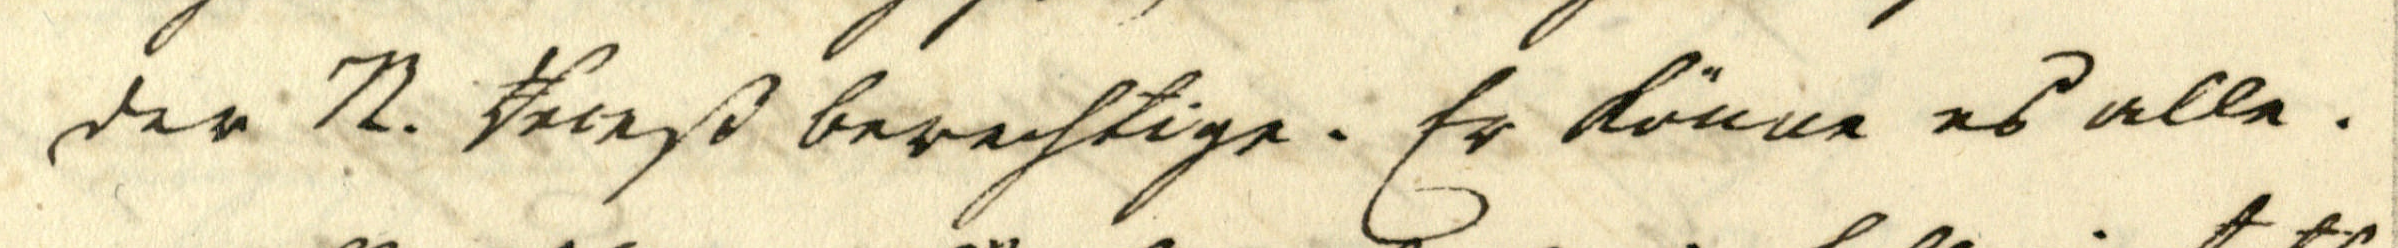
der N. Receß berechtige. Er könne es alle¬
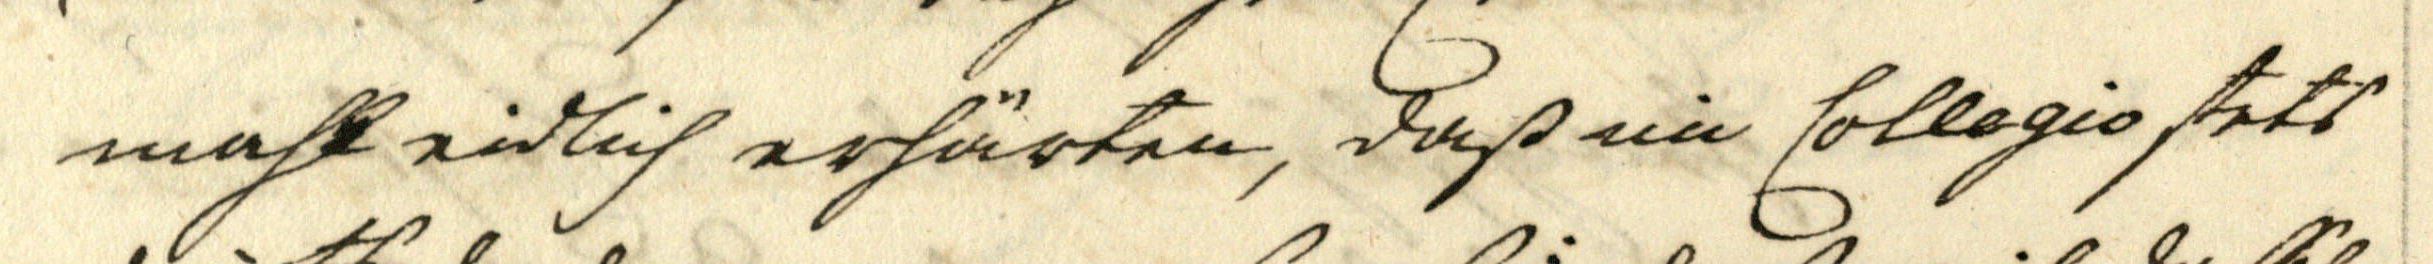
mahl eidlich erhärten, daß im Collegio stets
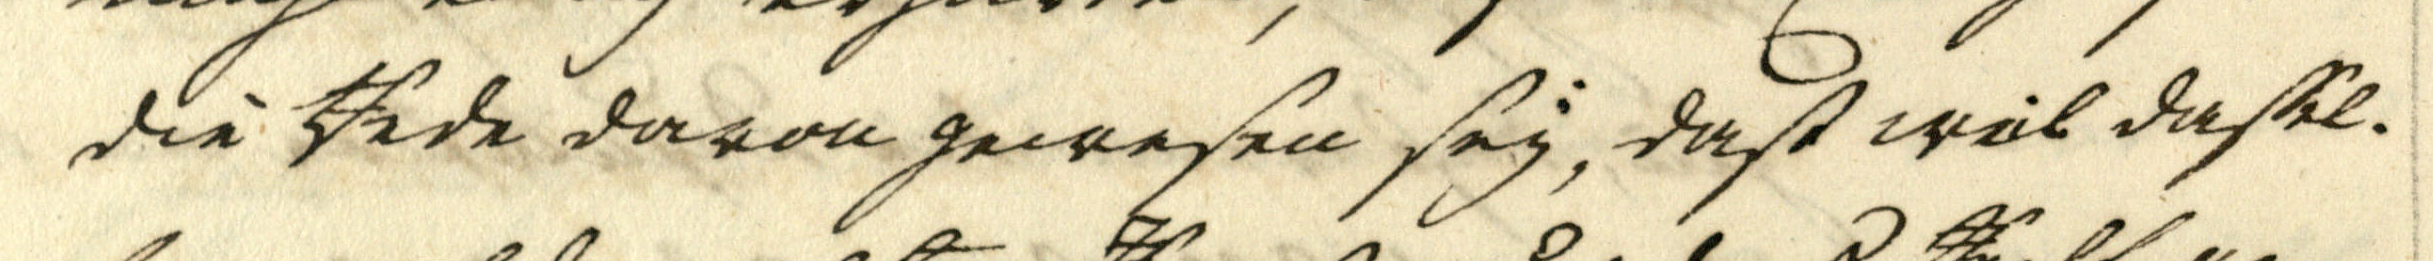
die Rede davon gewesen seÿ, daß weil dassel¬
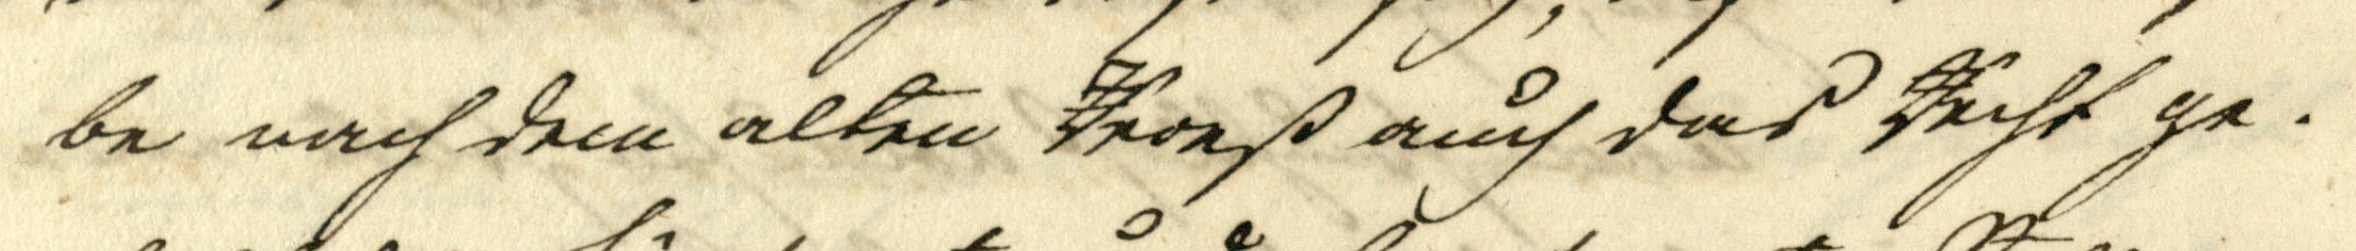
be nach dem alten Receß auch das Recht ge¬
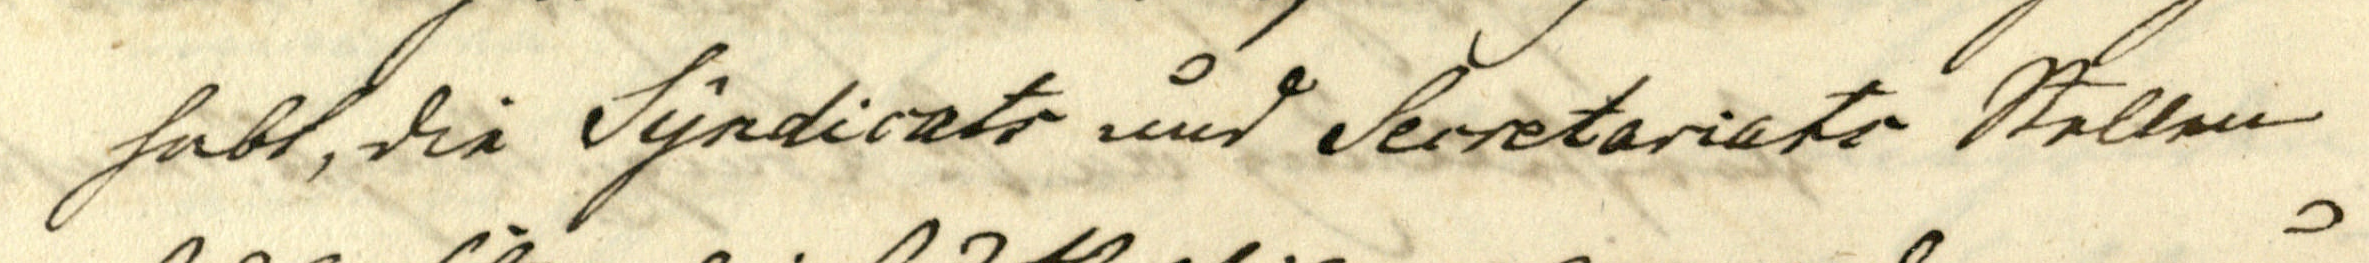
habt, die Sÿndicats und Secretariats Stellen
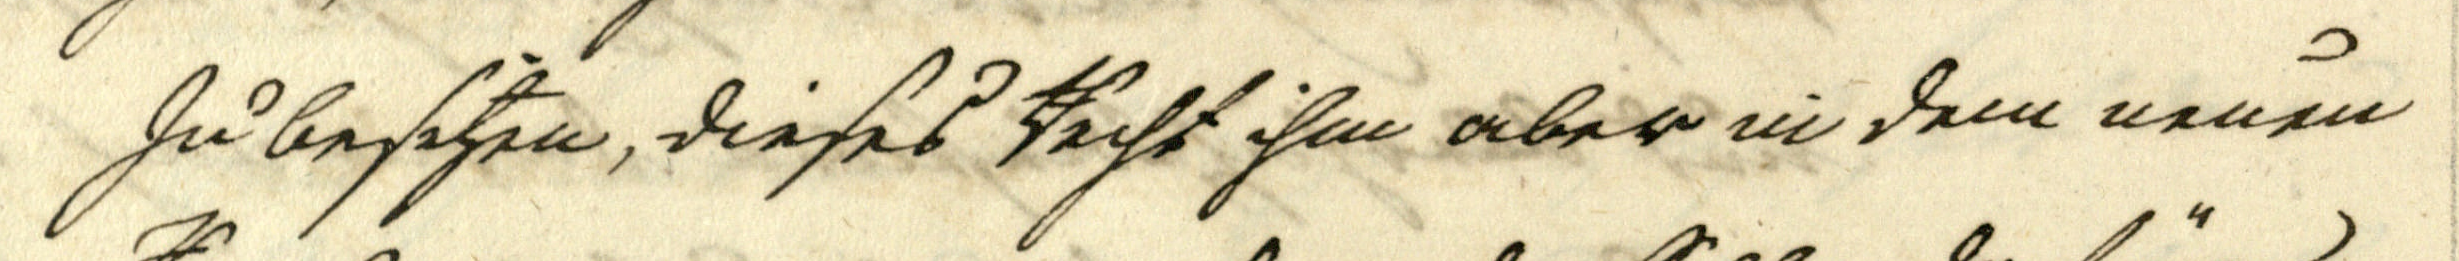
zu besetzen, dieses Recht ihm aber in dem neuen
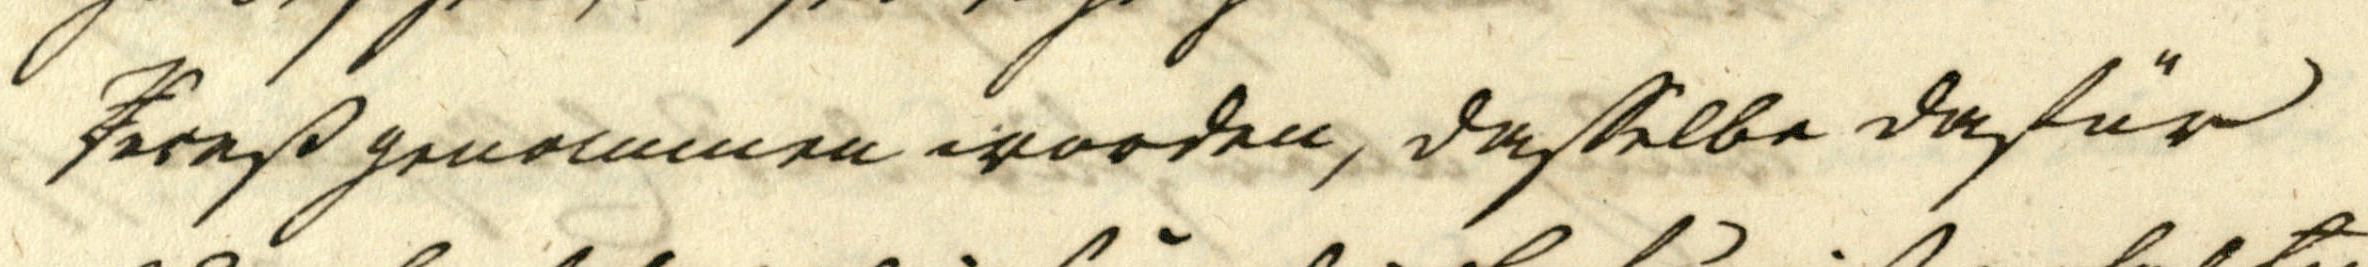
Receß genommen worden, dasselbe dafür
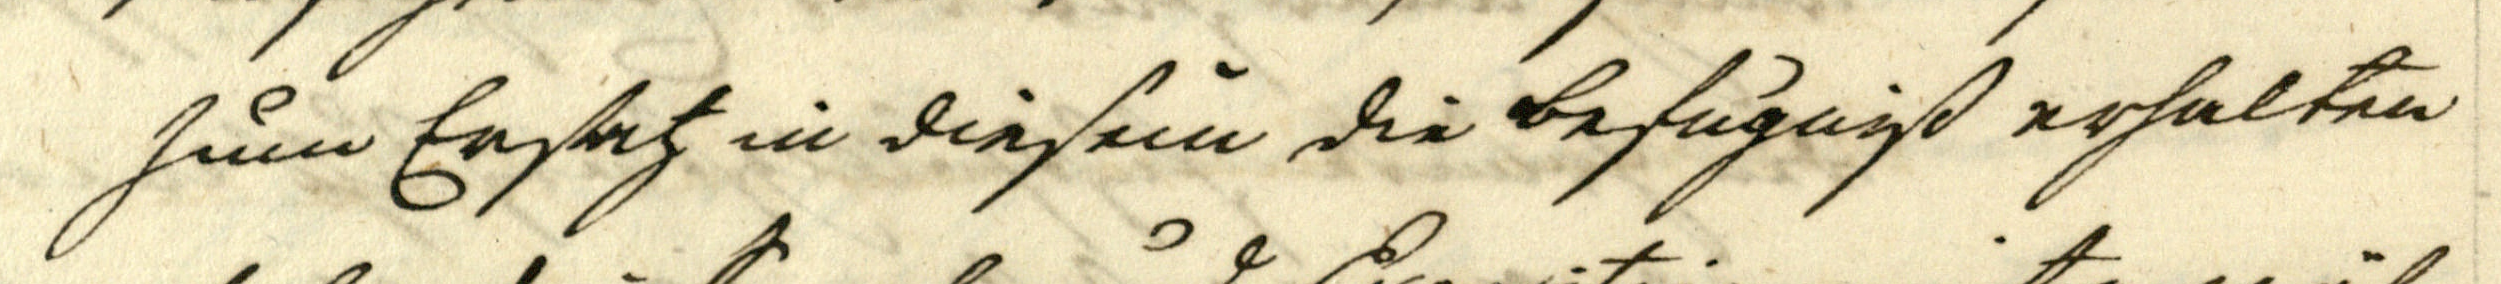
zum Ersatz in diesem die Befugniß erhalten
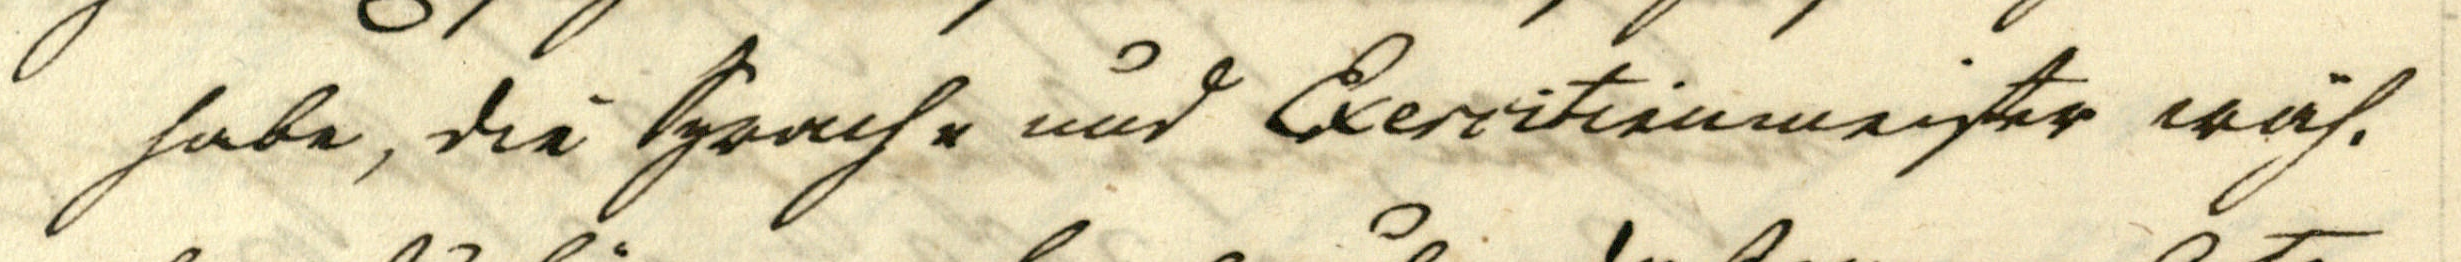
habe, die Sprach- und Exercitienmeister wäh¬
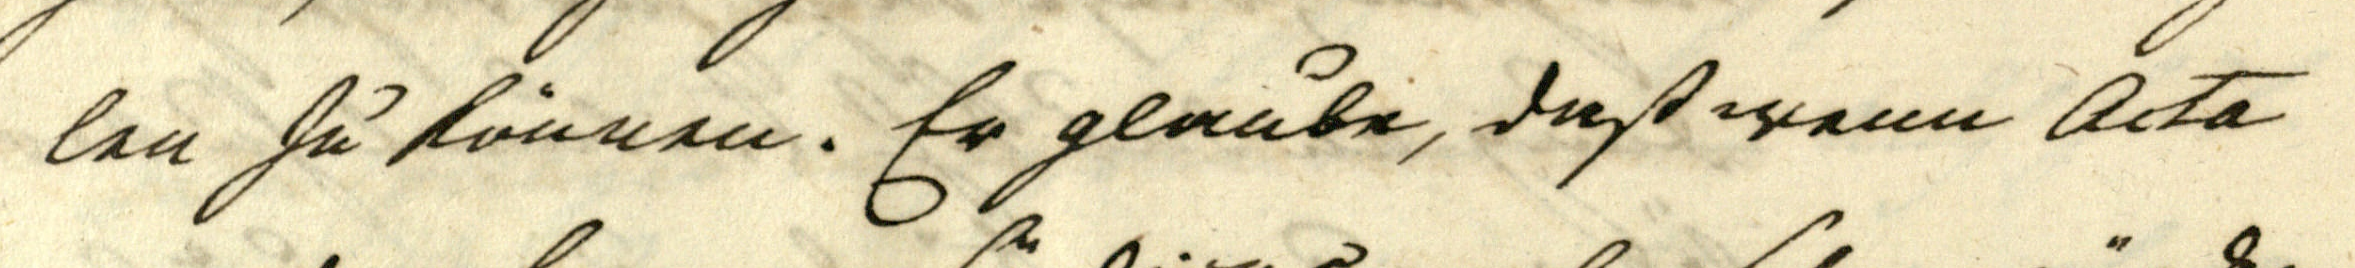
len zu können. Er glaube, daß wenn Acta
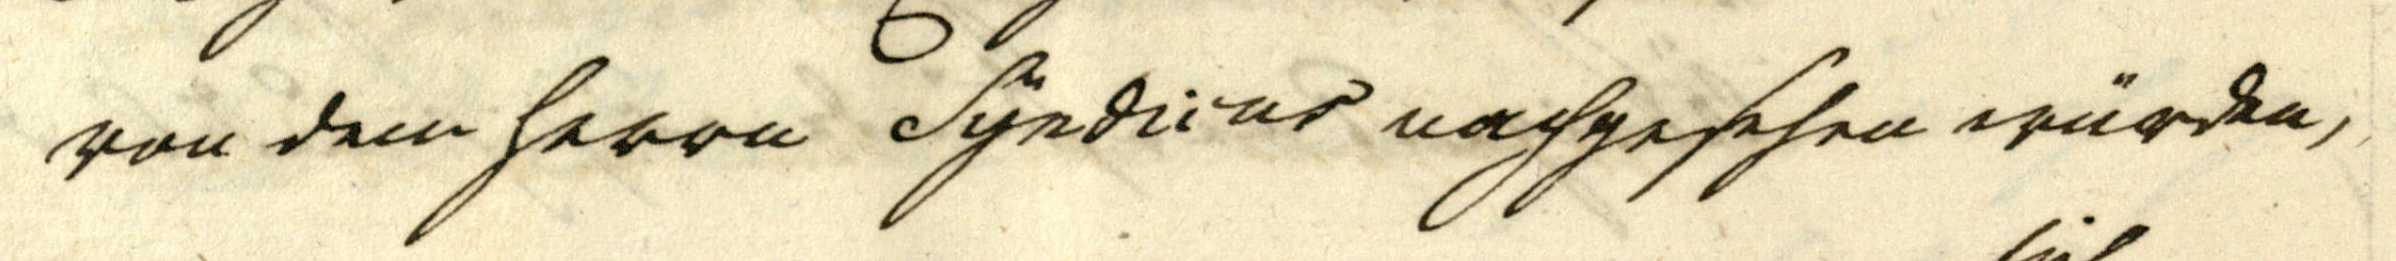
von dem Herrn Sÿndicus nahgesehen würden,
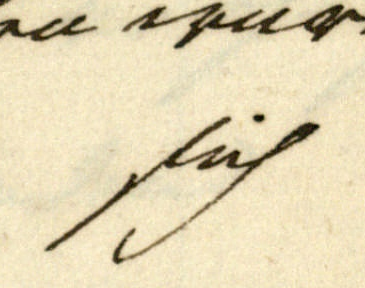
sich
